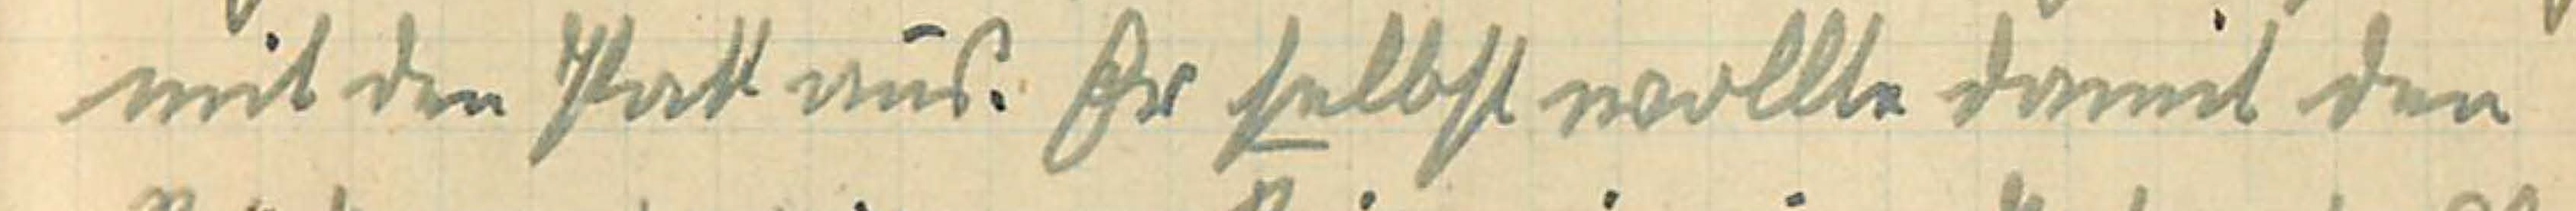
mit den Pak aus. Er selbst wollte damit den
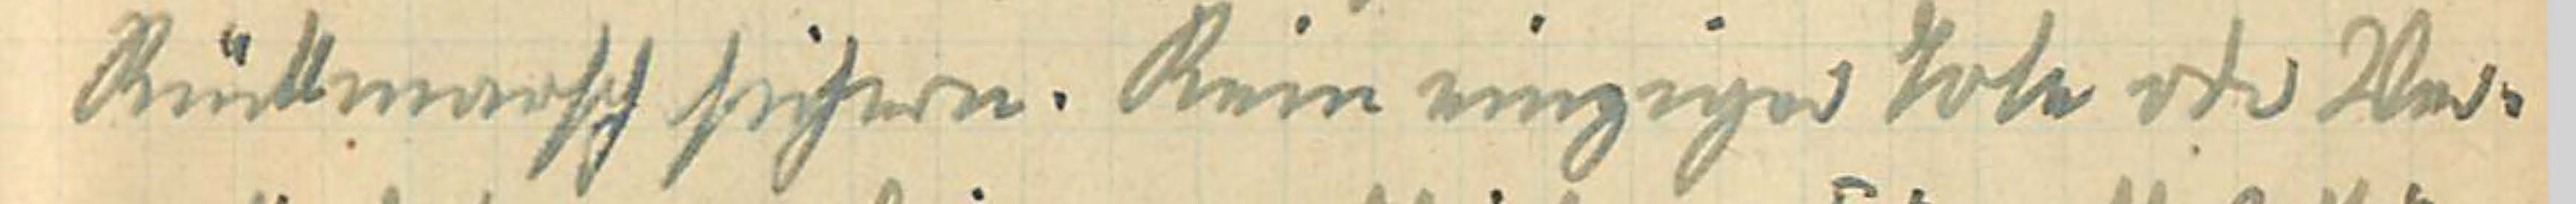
Rückmarsch sichern. Kein einziger Tote oder Ver-
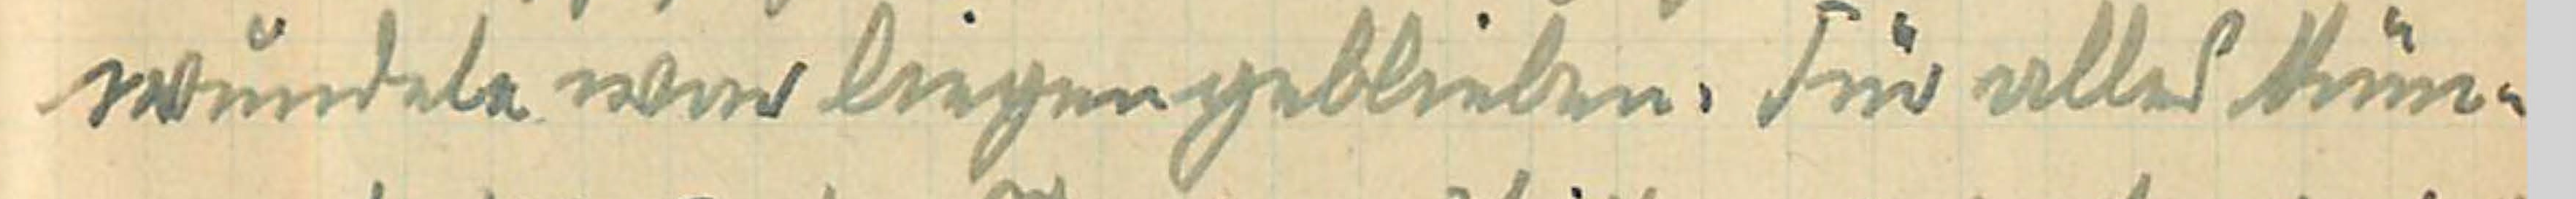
wundete war liegen geblieben. Für alles küm-
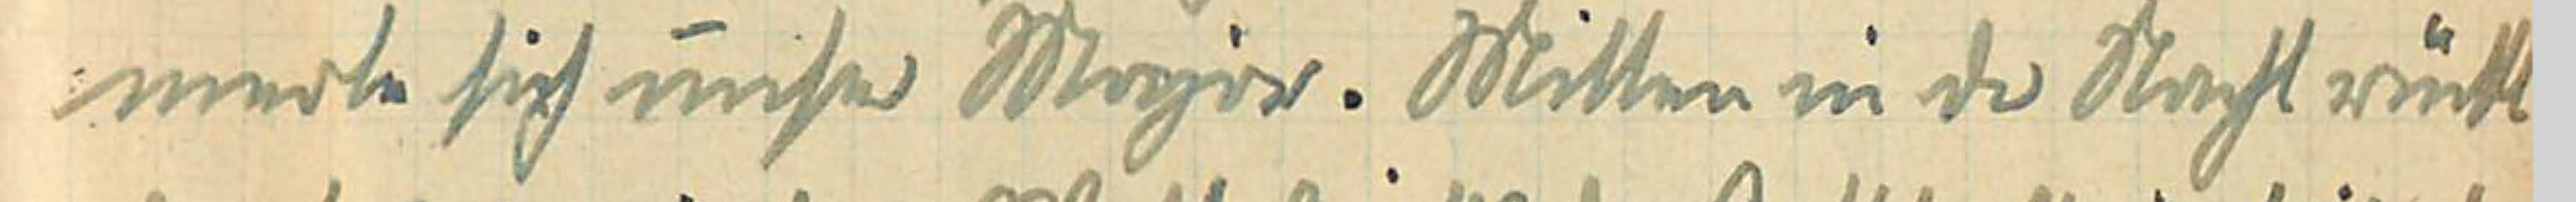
merte sich unser Major. Mitten in der Nacht rückt
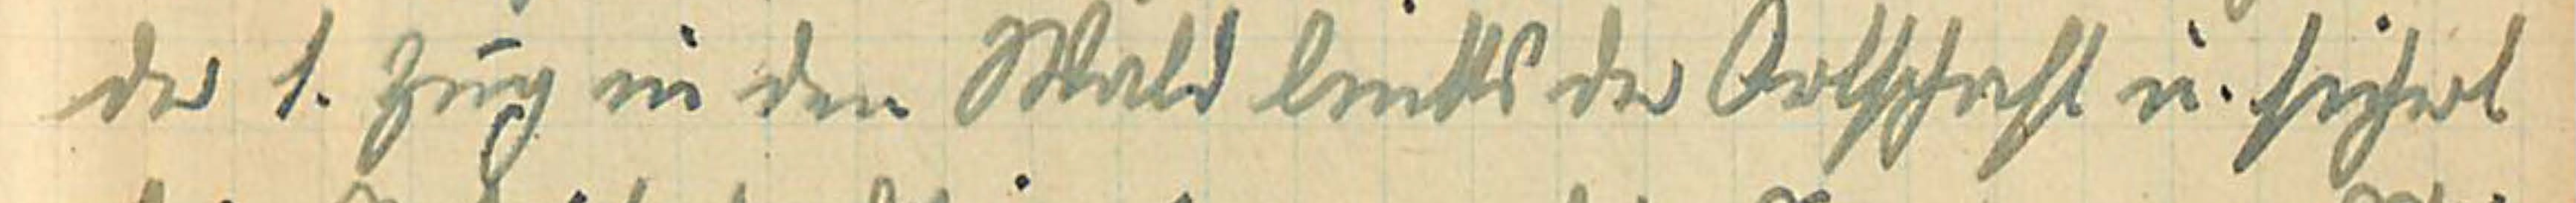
der 1. Zug in den Wald links der Ortschaft u. sichert
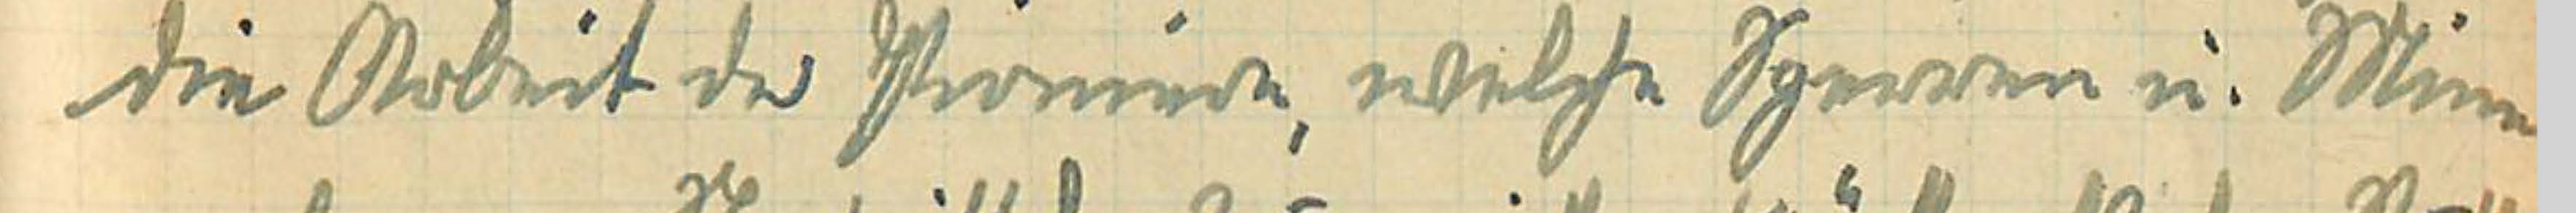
die Arbeit der Pioniere, welche Sperren u. Minen
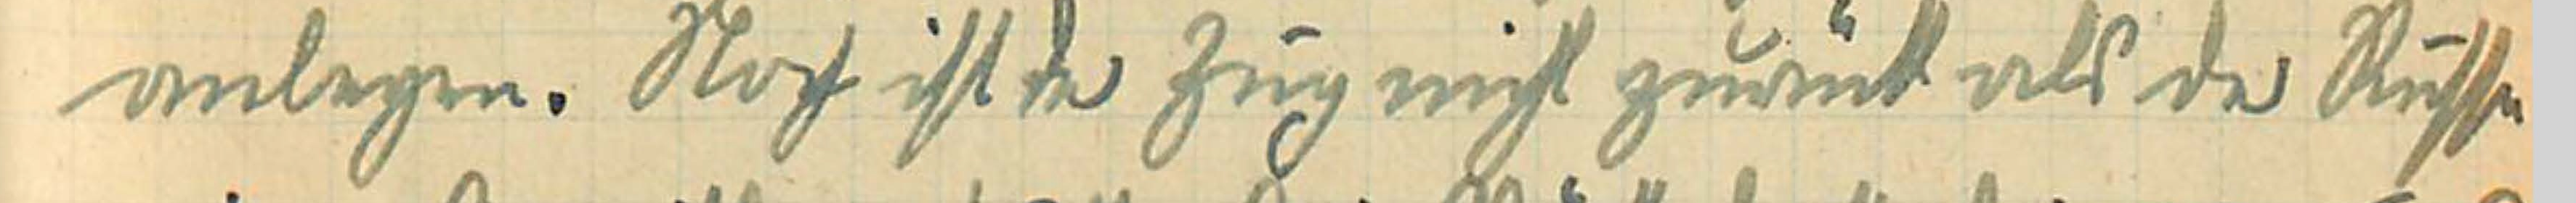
anlegen. Noch ist der Zug nicht zurück als der Russe
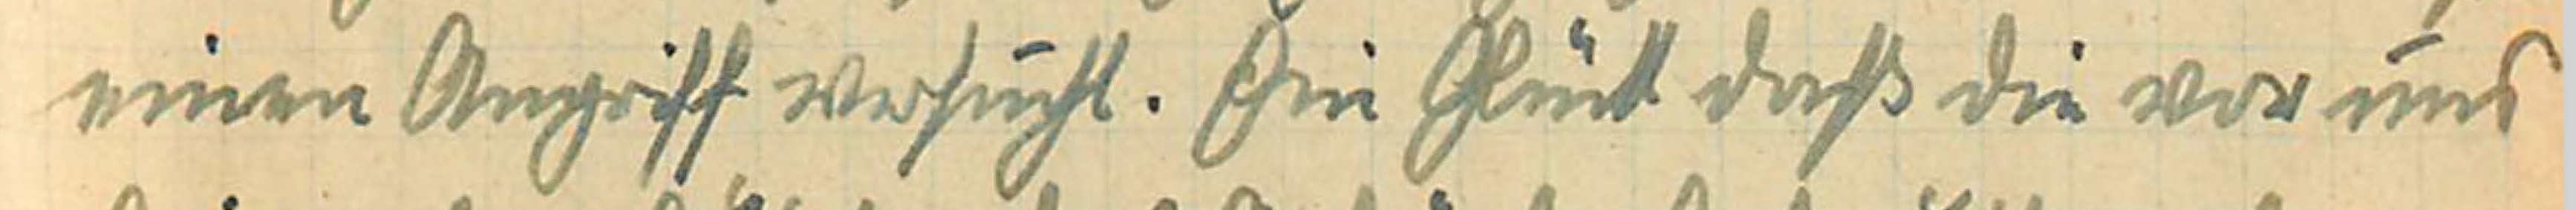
einen Angriff versucht. Ein Glück daß die vor uns
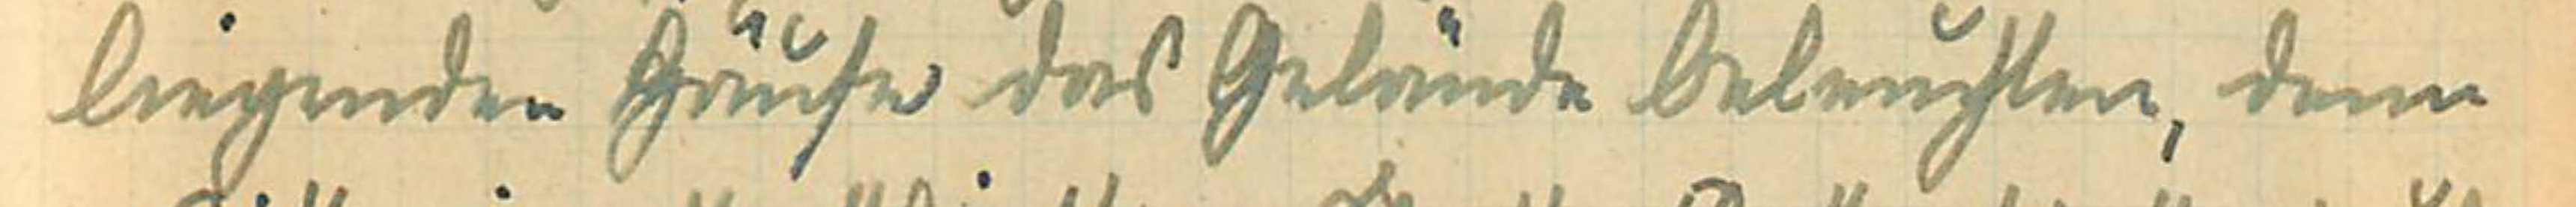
liegenden Häuser das Gelände beleuchten, denn
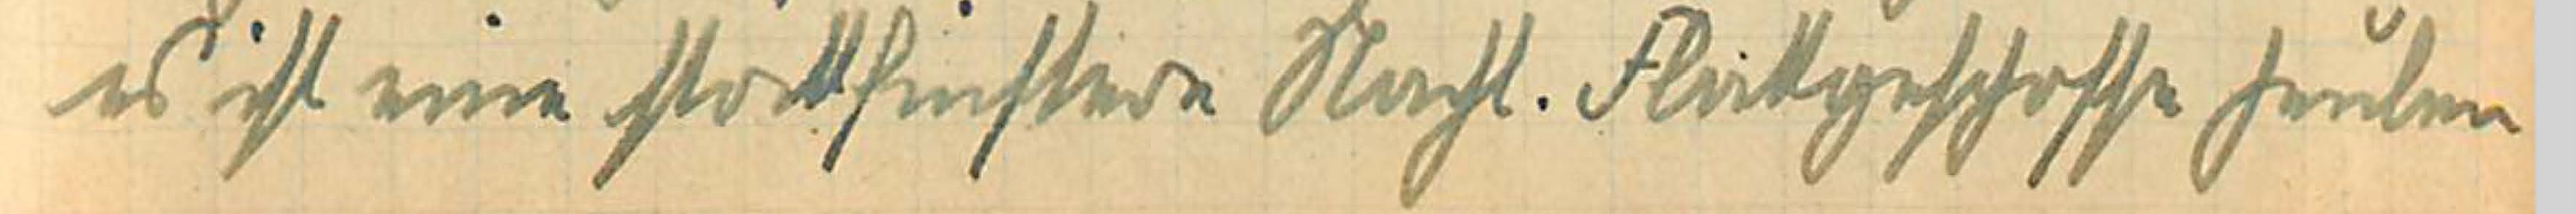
es ist eine stockfinstere Nacht. Flakgeschosse heulen
